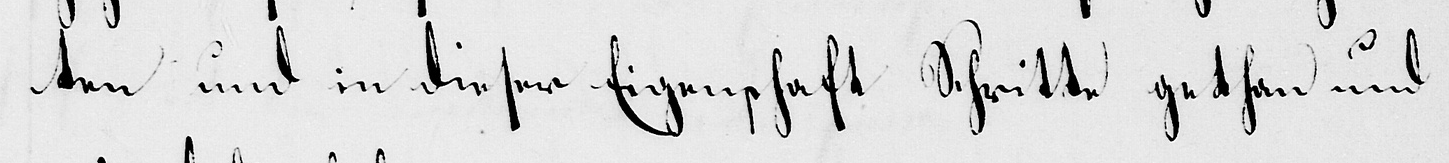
ten und in dieser Eigenschaft Schritte gethan und
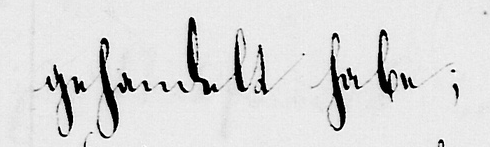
gehandelt habe;
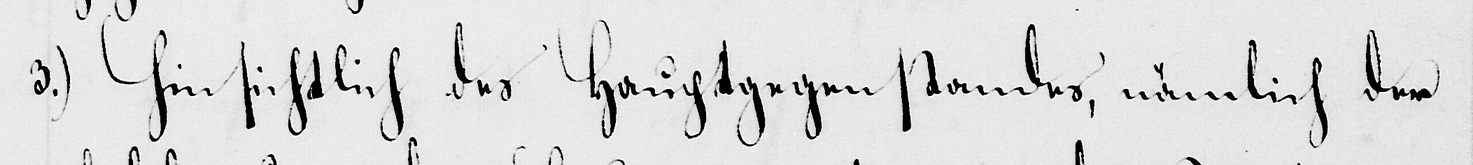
3.) Hinsichtlich des Hauptgegenstandes, nämlich der
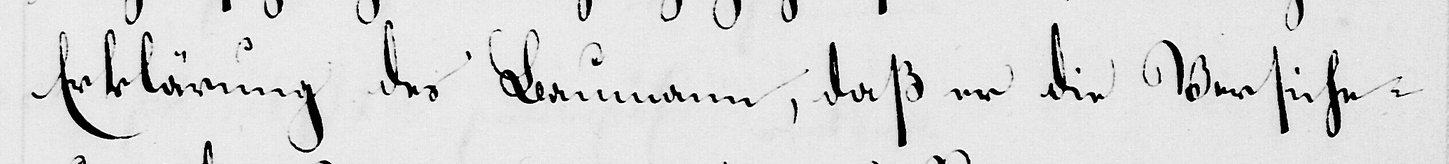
Erklärung des Baumann, daß er die Versiche¬
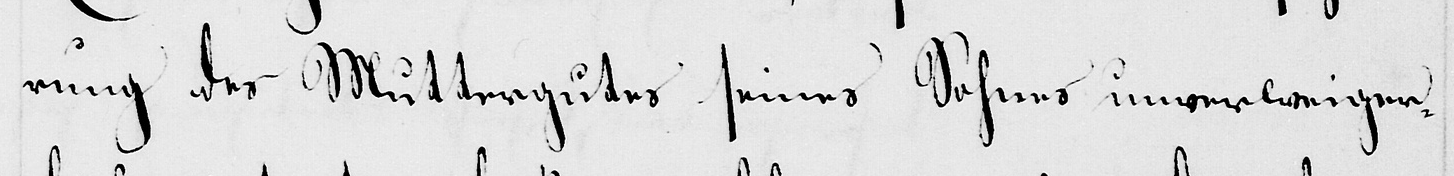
rung des Muttergutes seines Sohnes unverweiger¬
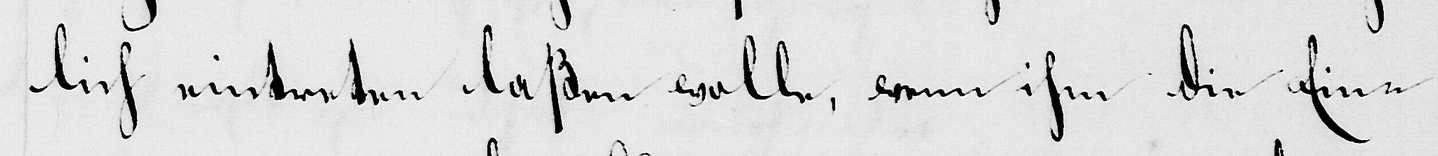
lich eintreten laßen wolle, wenn ihm die Ein¬
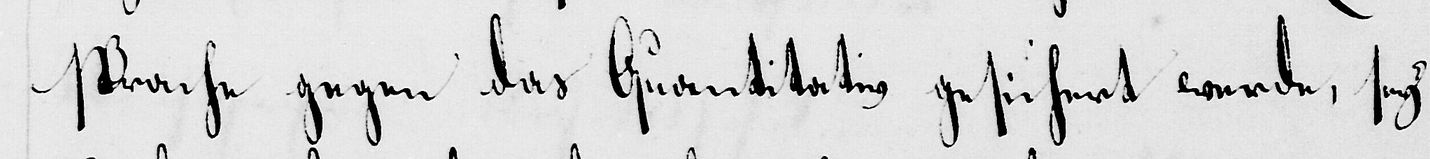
sprache gegen das Quantitativ gesichert werde, sey
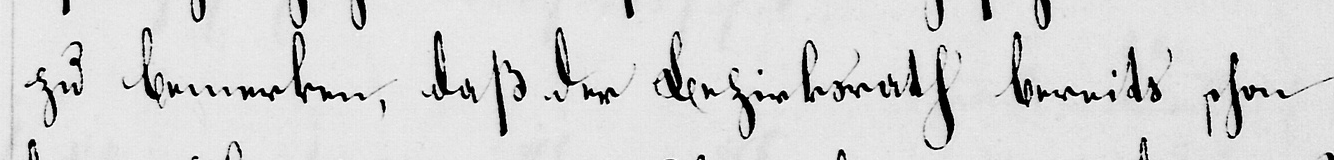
zu bemerken, daß der Bezirksrath bereits schon
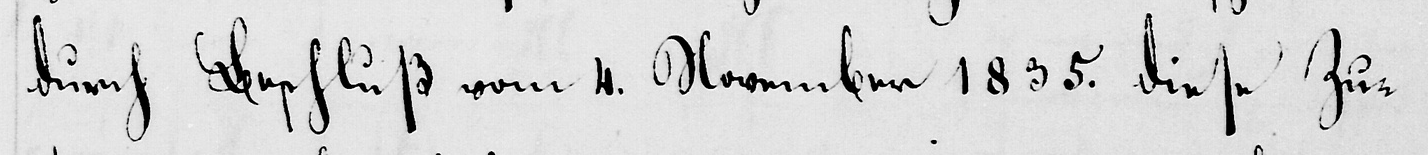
durch Beschluß vom 4. November 1835. diese Zu¬
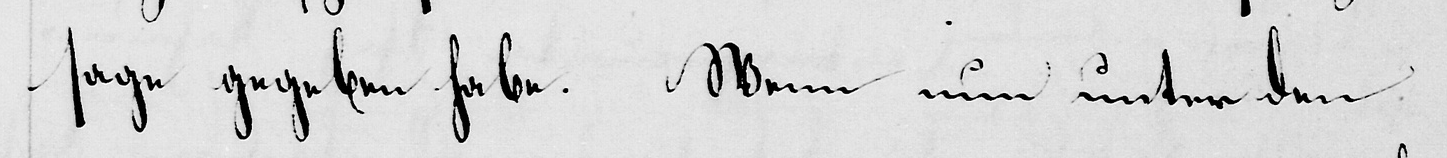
sage gegeben habe. Wenn nun unter den
